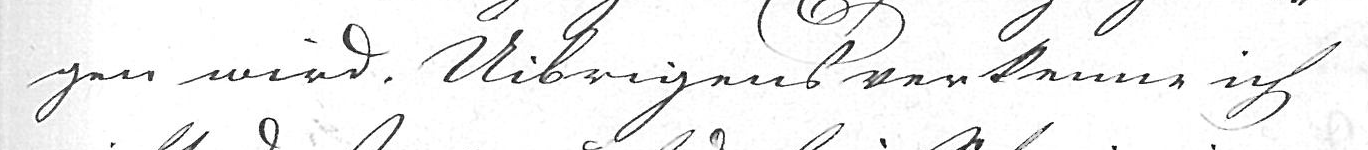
gen wird. Uibrigens verkenne ich
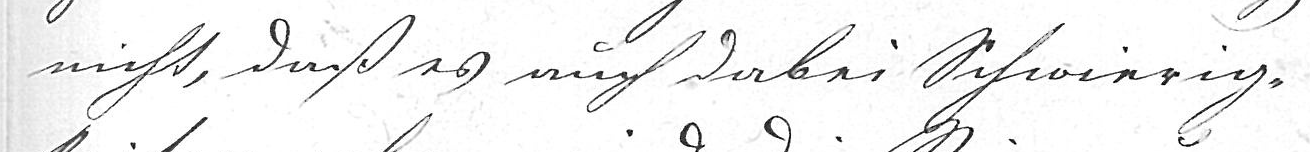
nicht, daß es auch dabei Schwierig-
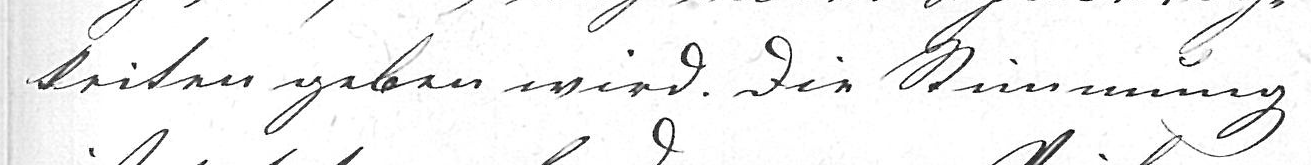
keiten geben wird. Die Stimmung
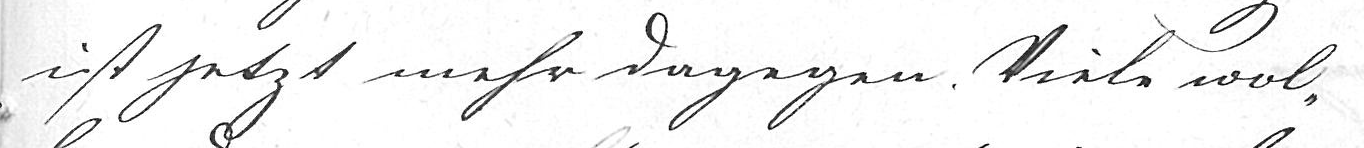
ist jetzt mehr dagegen. Viele wol-
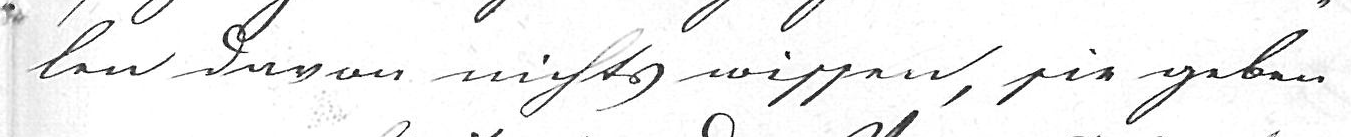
len davon nichts wissen, sie geben
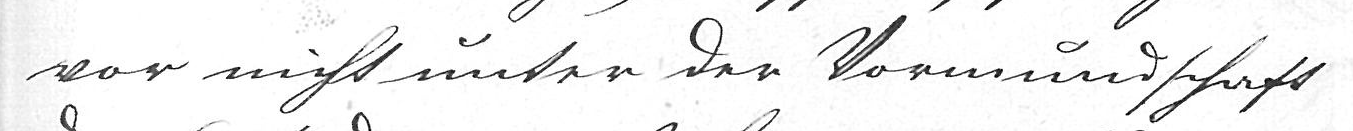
vor nicht unter der Vormundschaft
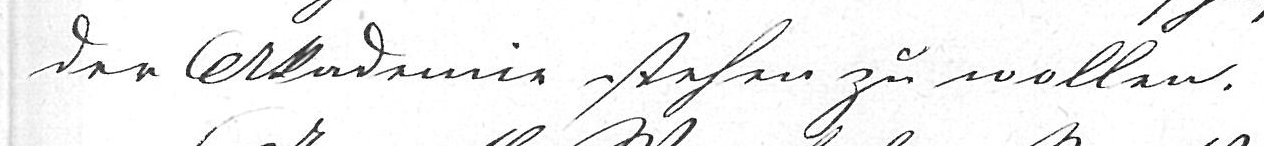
der Akademie stehen zu wollen.
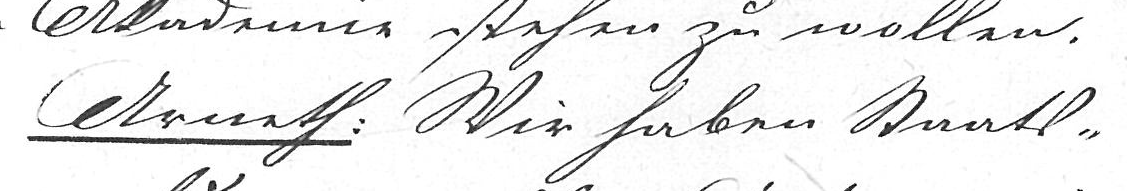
Arneth: Wir haben Staats-
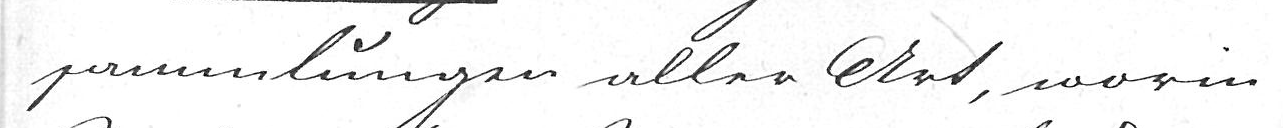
sammlungen aller Art, worin
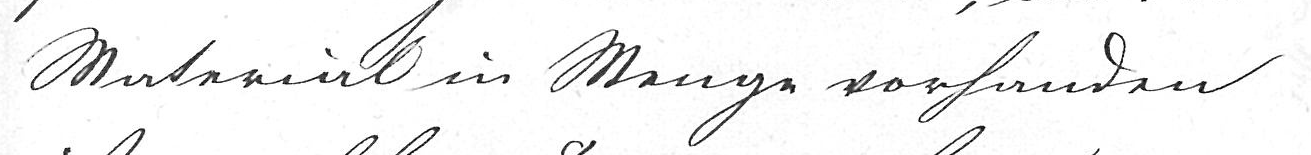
Material in Menge vorhanden
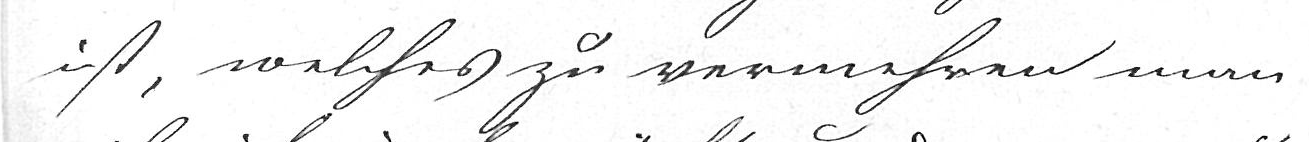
ist, welches zu vermehren man
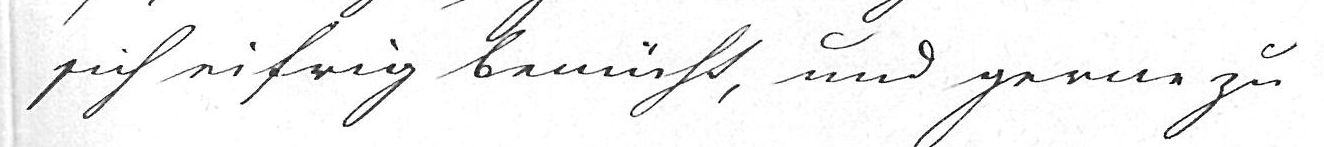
sich eifrig bemüht, und gerne zu
